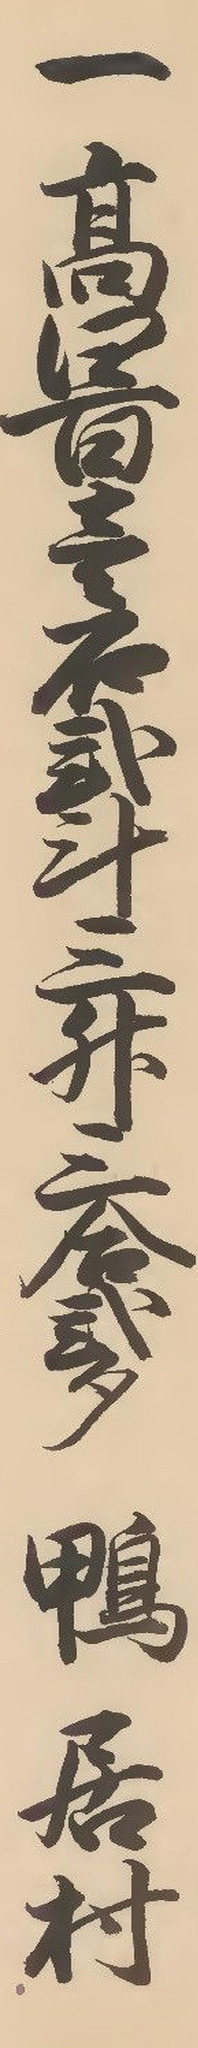一高四百壱石弐斗三升三合弐勺鴨居村
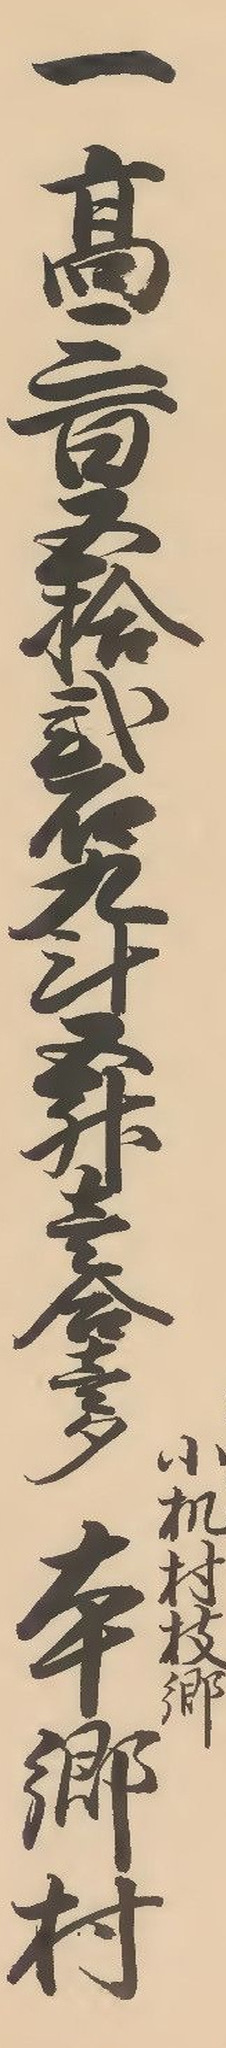一高三百五拾弐石九斗五升壱合壱勺本郷村
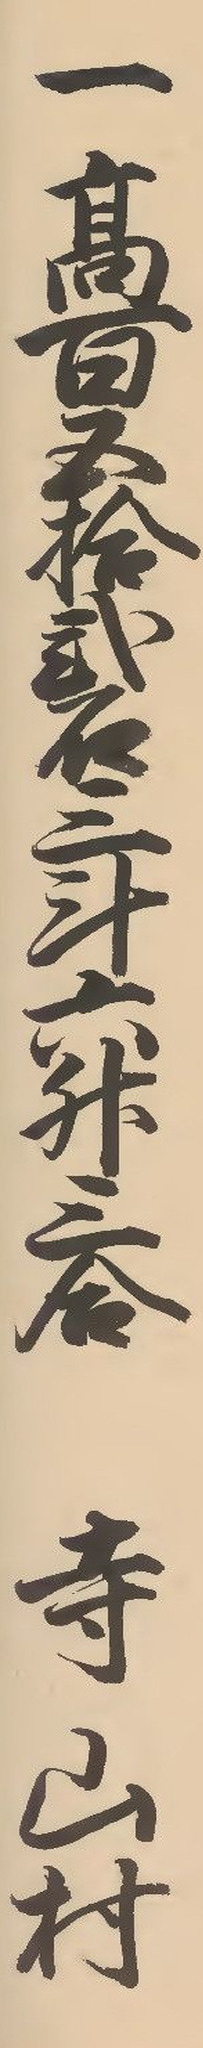一高百五拾弐石三斗六升三合寺山村
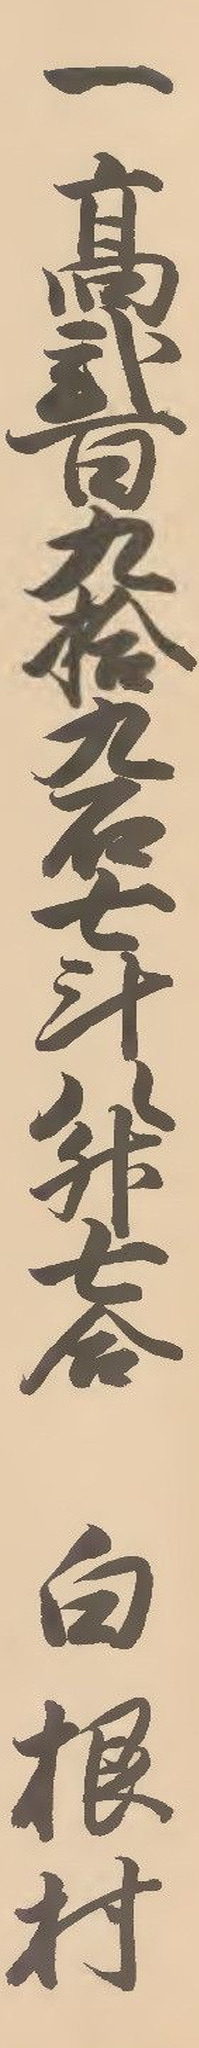一高弐百九拾九石七斗八升七合白根村
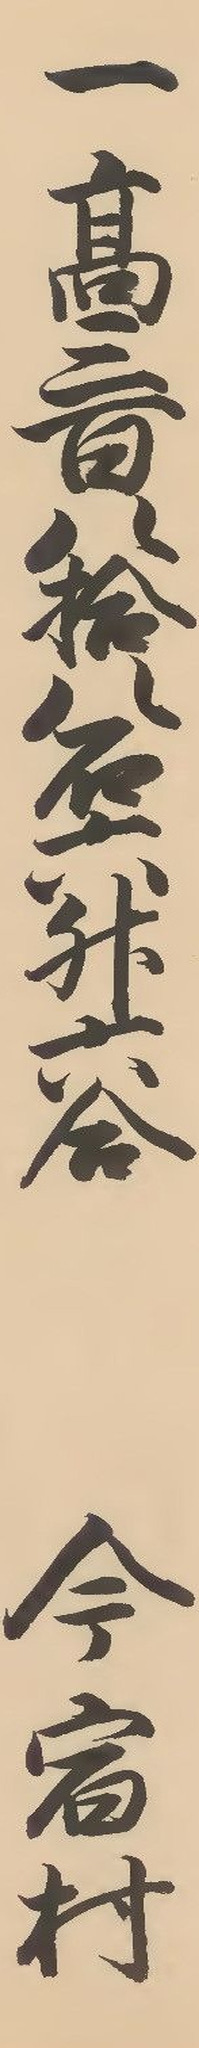一高三百八拾八石六升六合今宿村
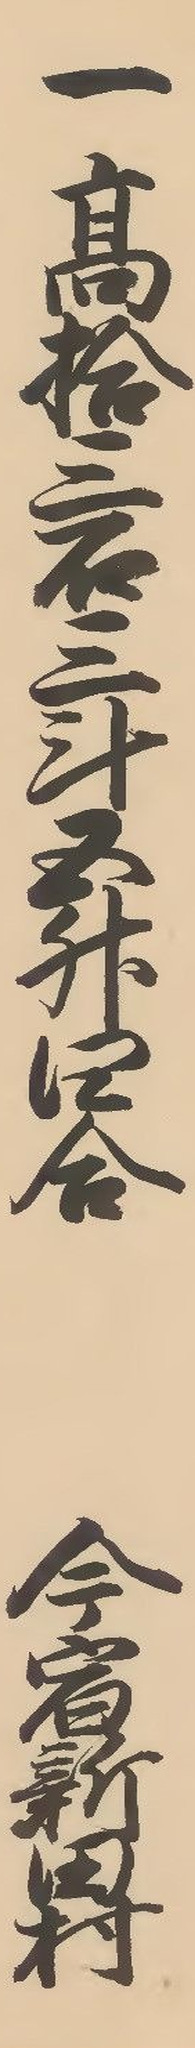一高拾三石三斗五升四合今宿新田村
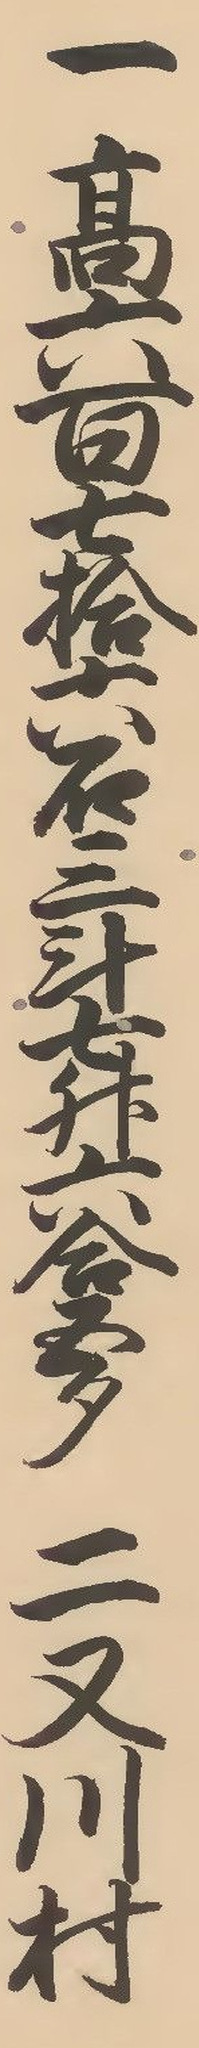一高六百七拾六石三斗七升六合五勺二又川村

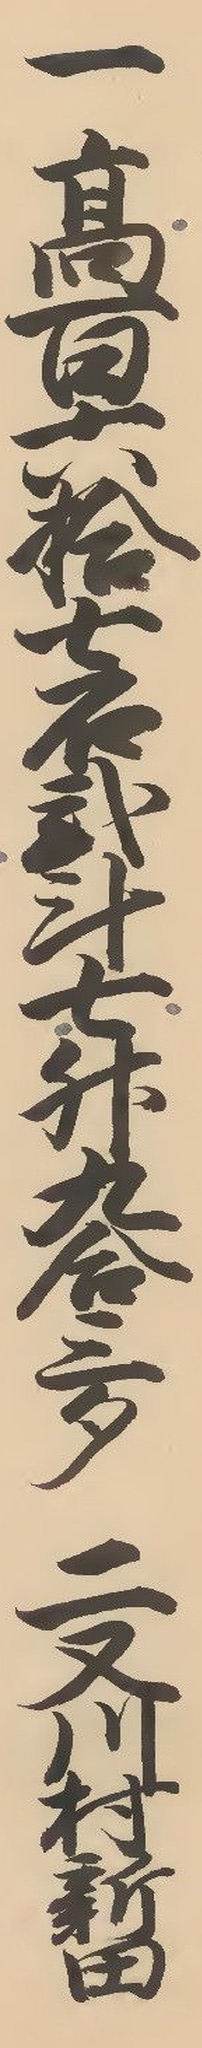一高百六拾七石弐斗七升九合三勺二又川村新田
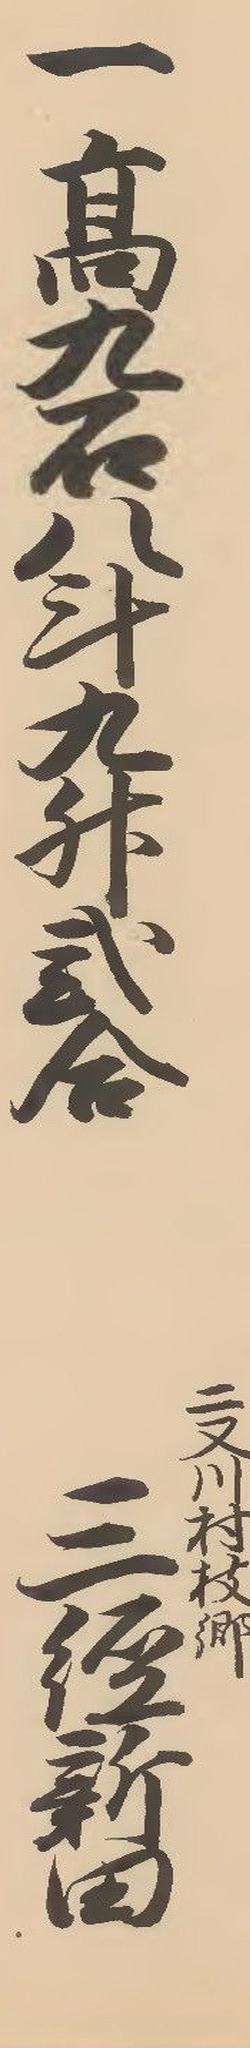一高九石八斗九升弐合三経新田
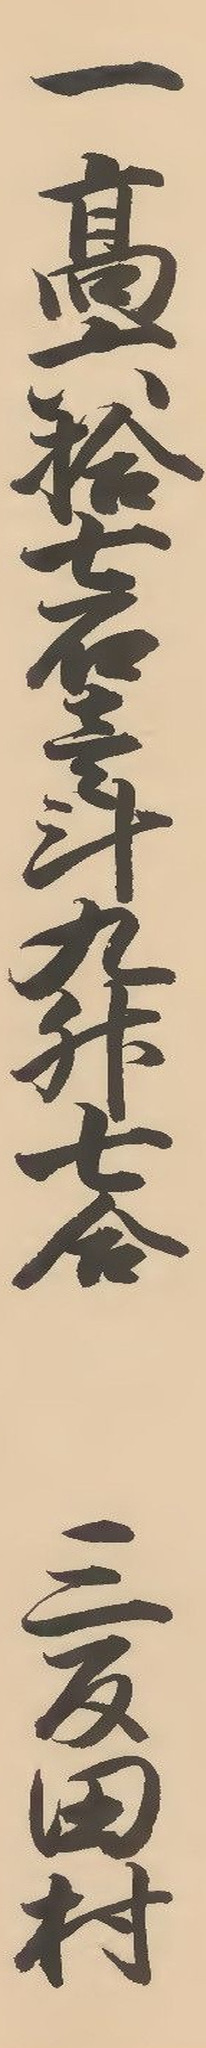一高六拾七石壱斗九升七合三反田村
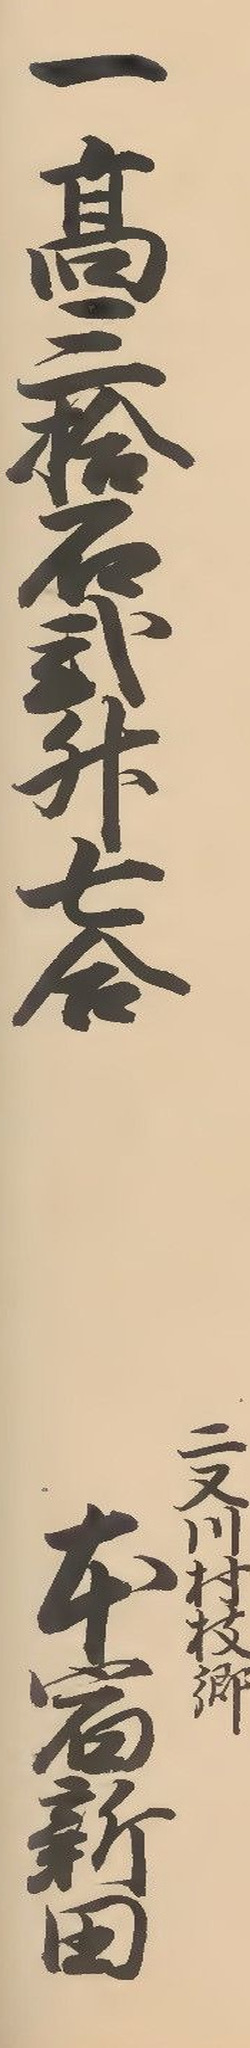一高三拾石弐升七合本宿新田
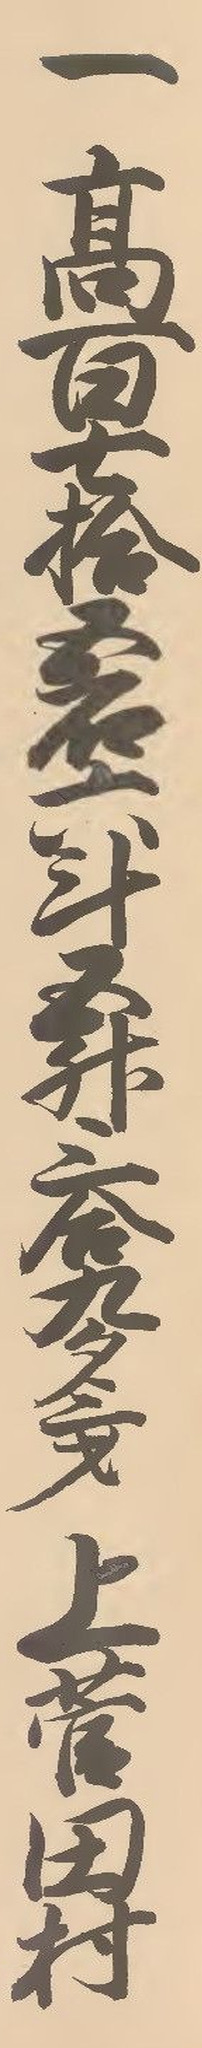一高百七拾五石六斗五升三合九勺三才上菅田村
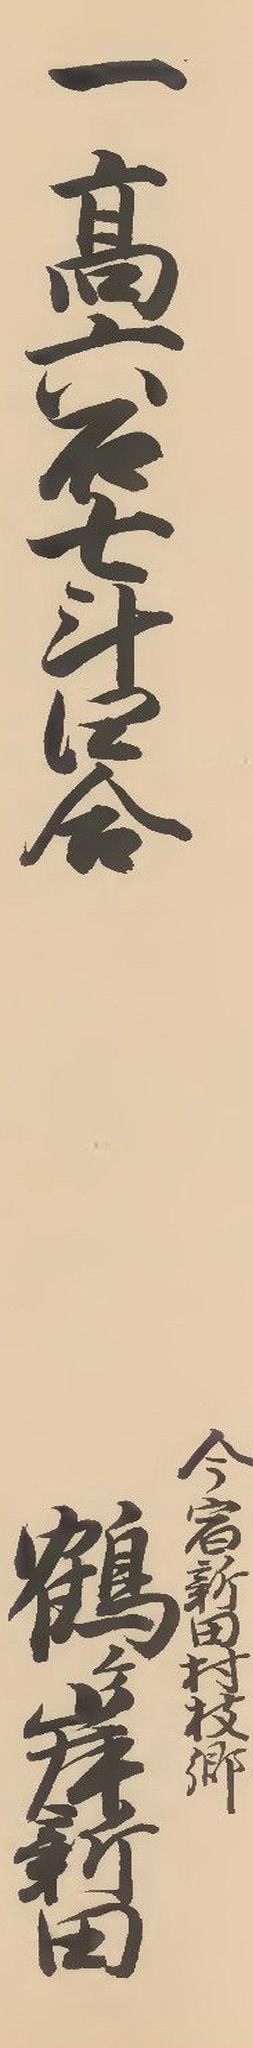一高六石七斗四合鶴ヶ岸新田
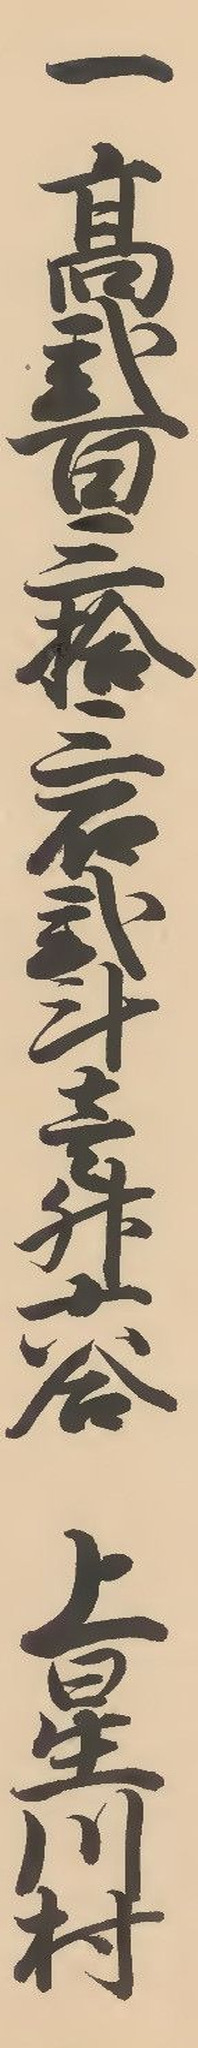一高弐百三拾三石弐斗壱升六合上星川村
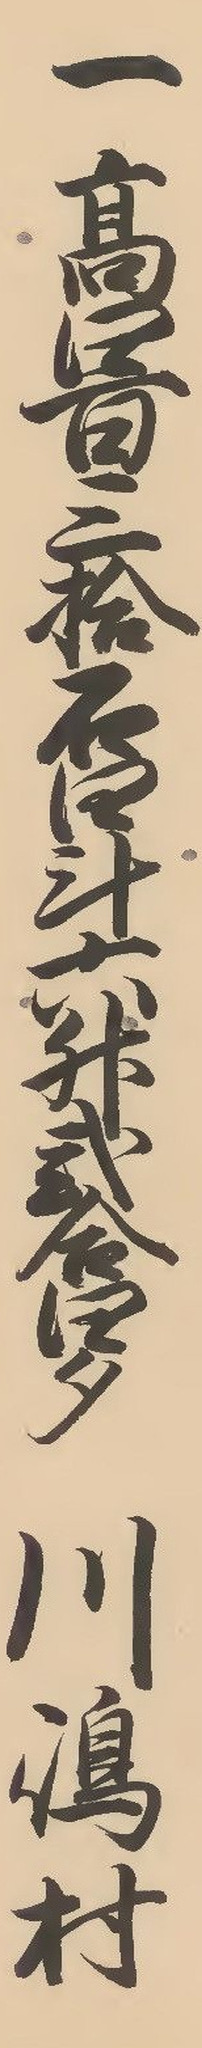一高四百三拾石四斗六升弐合四勺川嶋村

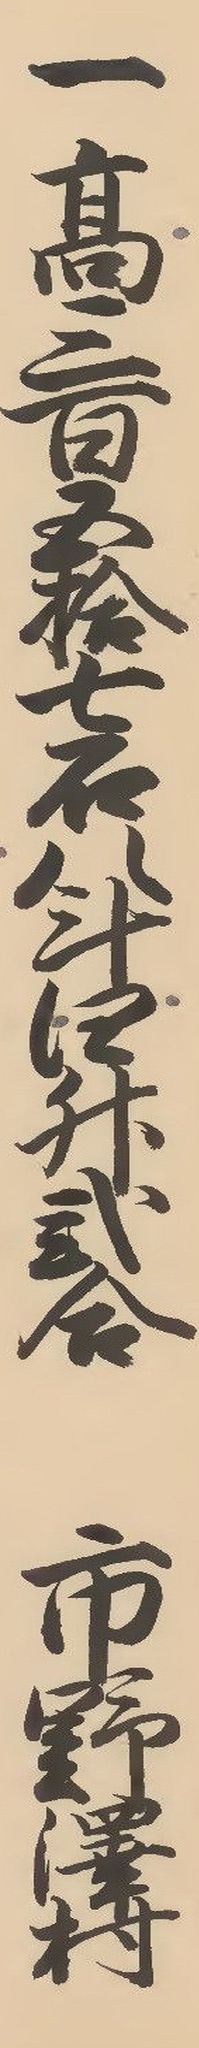一高三百五拾七石八斗四升弐合市野澤村
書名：武蔵国郷帳　上
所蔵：国立公文書館 National Archives of Japan
